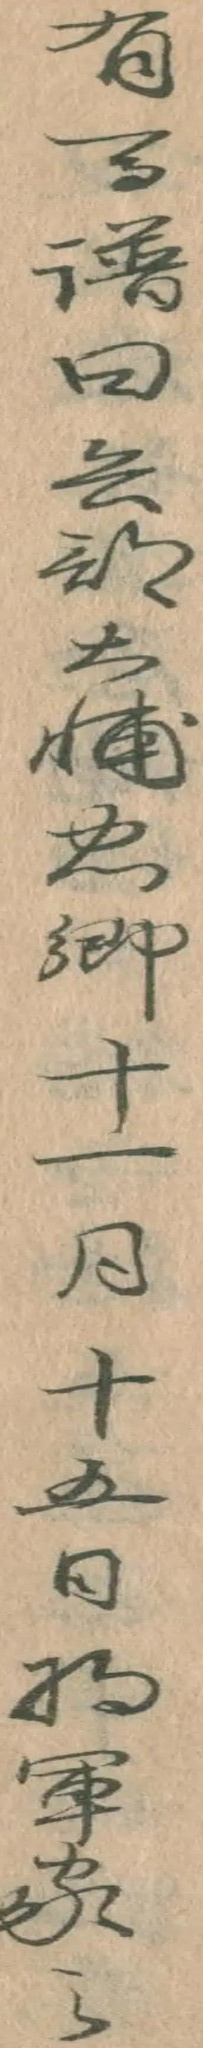有馬譜曰兵部大輔忠郷十一月十五日将軍家之
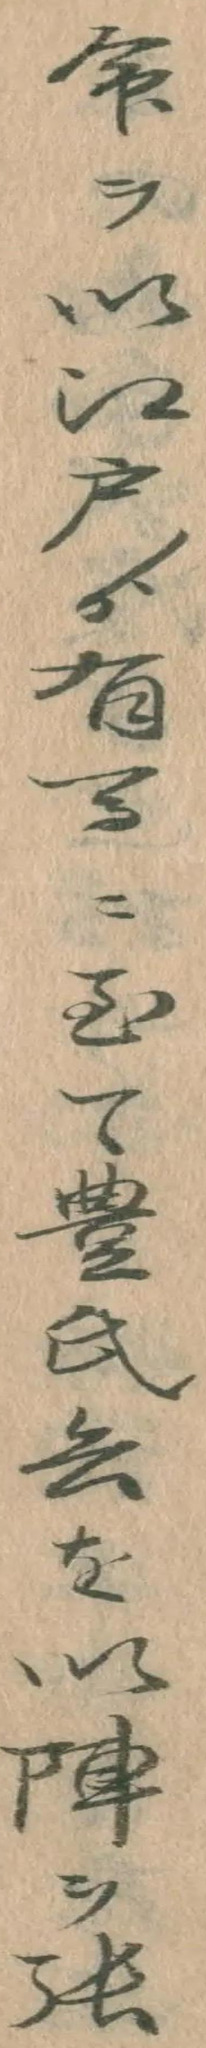令ヲ以江戸ゟ有馬ニ至て豊氏兵を以陣ヲ張
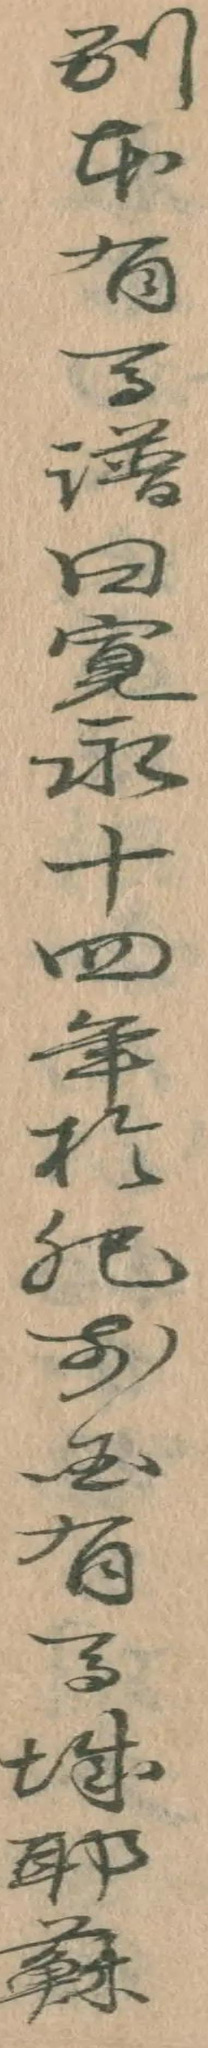別本有馬譜曰寛永十四年於肥前国有馬城耶蘇
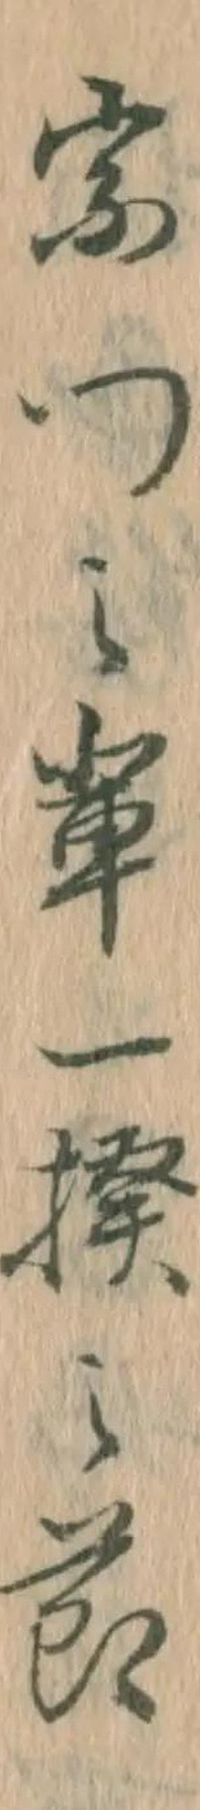宗門之輩一揆之節
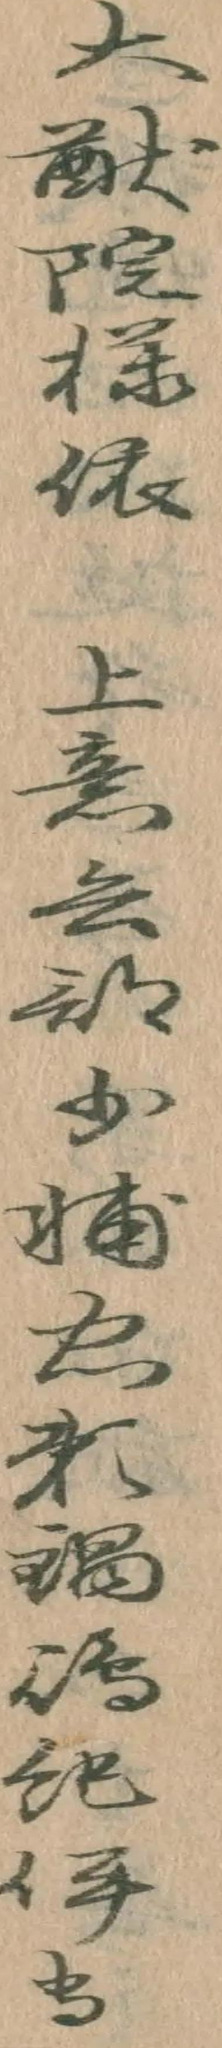大猷院様依上意兵部少輔忠頼鍋島紀伊守
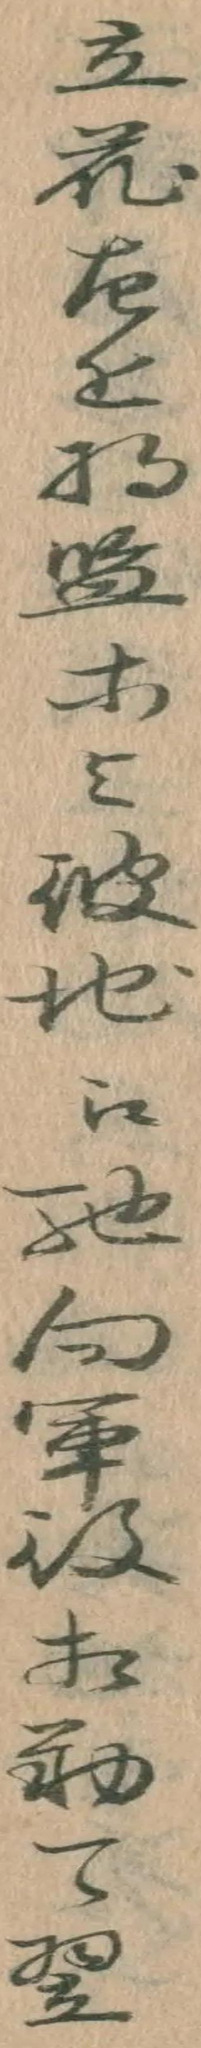立花左近将監等と彼地江馳向軍役相勤て翌
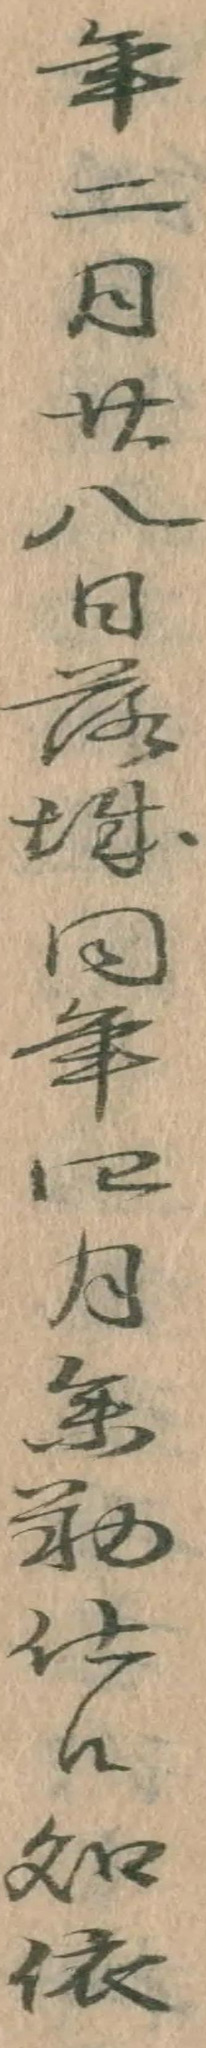年二月廿八日落城同年四月参勤仕候処依
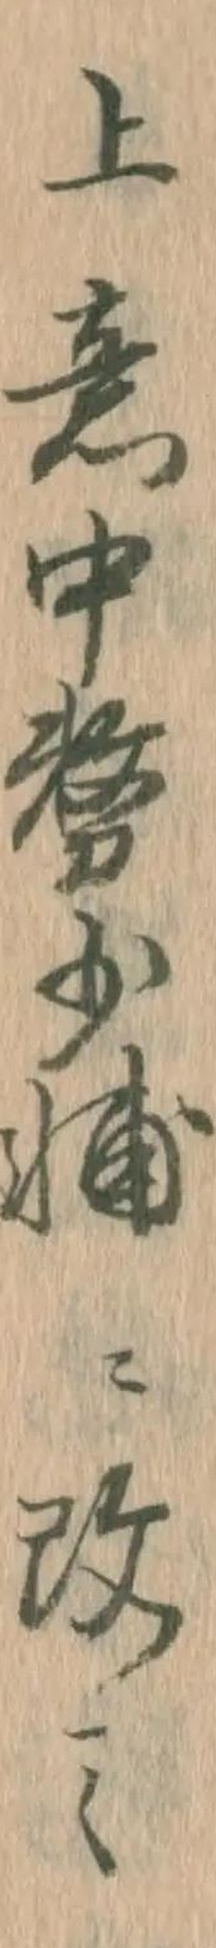上意中務少輔に改之
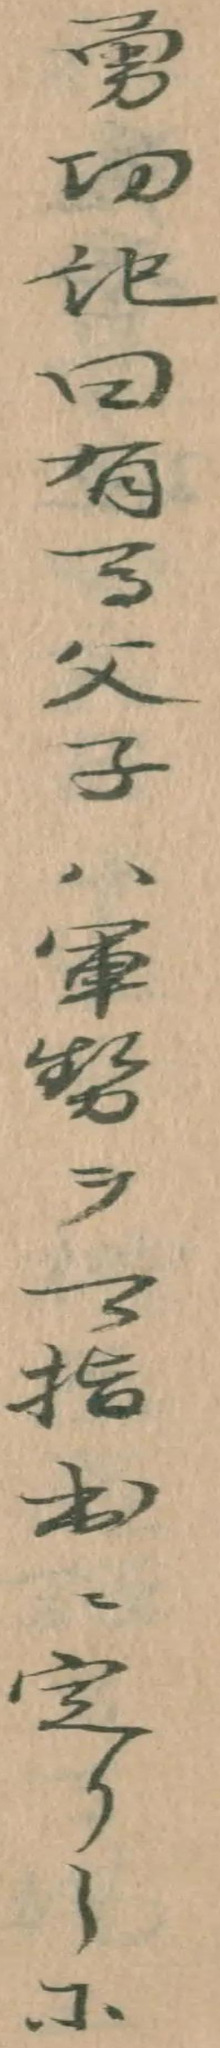勇功記曰有馬父子は軍勢ヲ可指出に定りしに
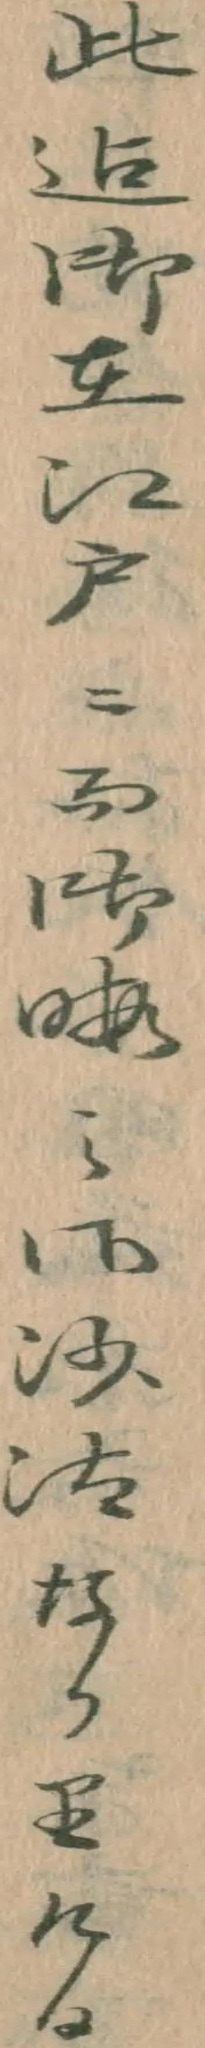比迄御在江戸に而御咄之御沙汰なかりける
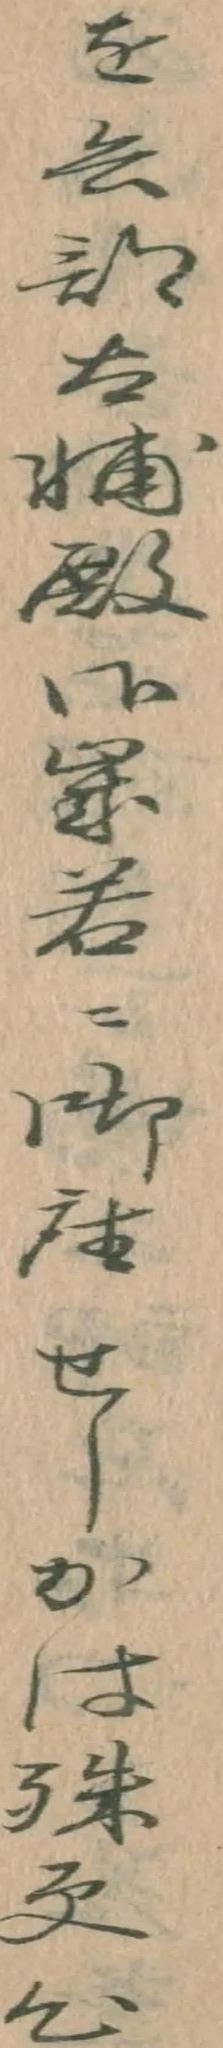を兵部大輔殿御歳若に御座せしかは殊更心
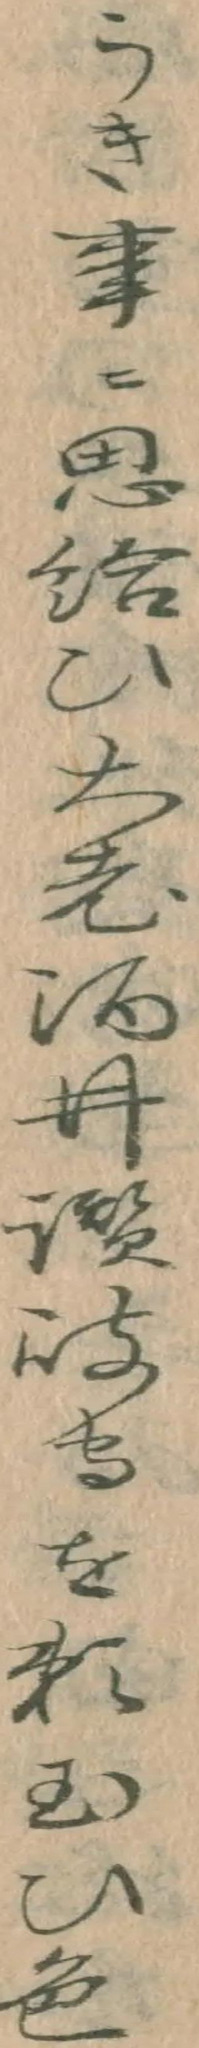うき事に思給ひ大老酒井讃岐守を頼玉ひ色
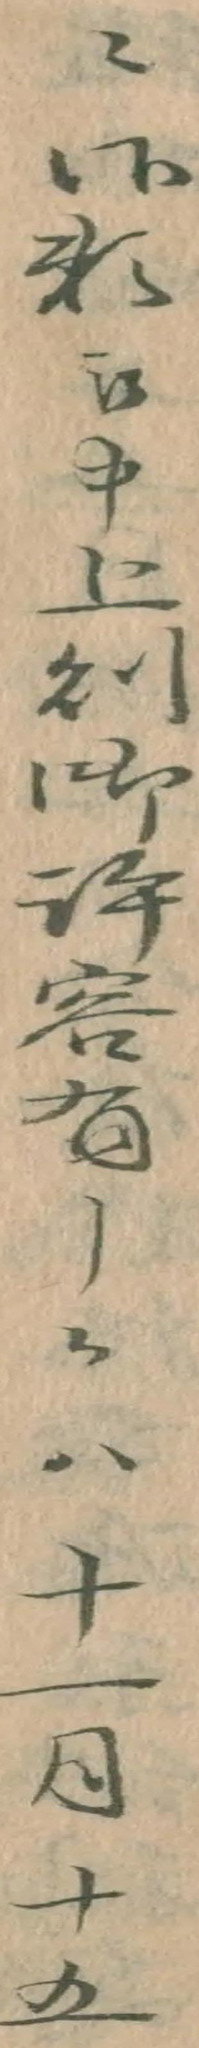々御頼被申上則御許容有しかは十一月十五
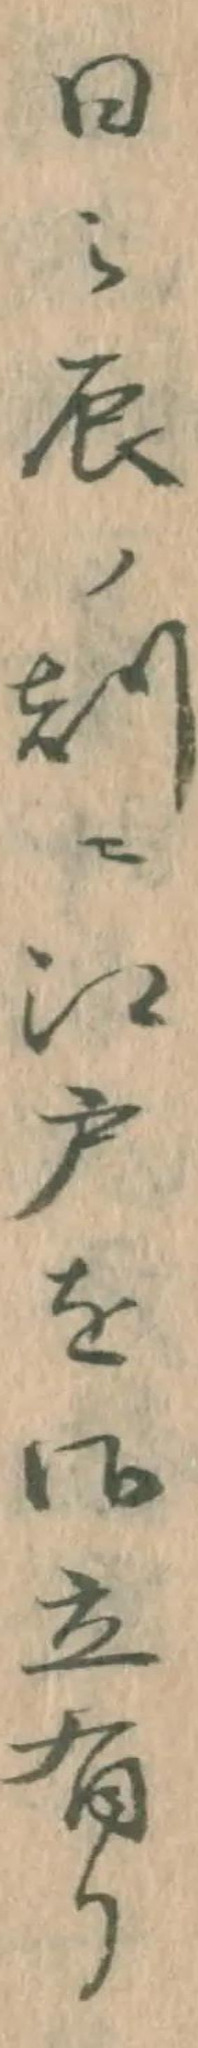日之辰ノ刻に江戸を御立有り
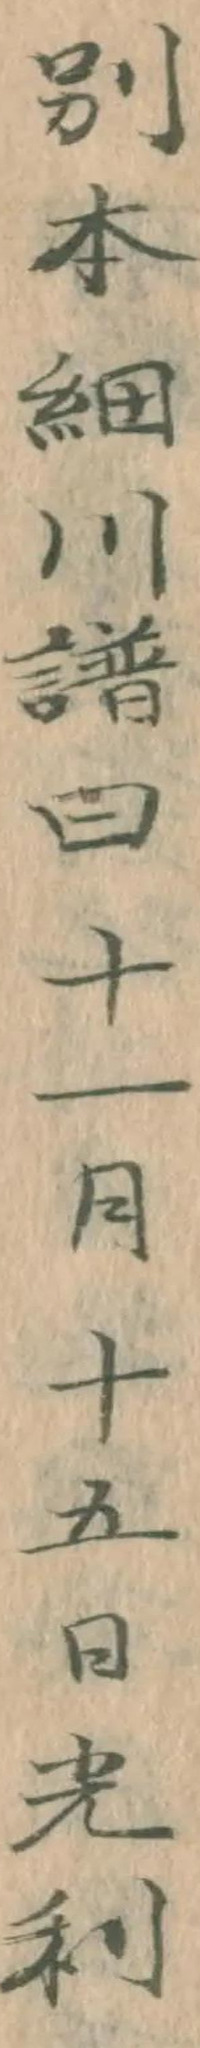別本細川譜曰十一月十五日光利
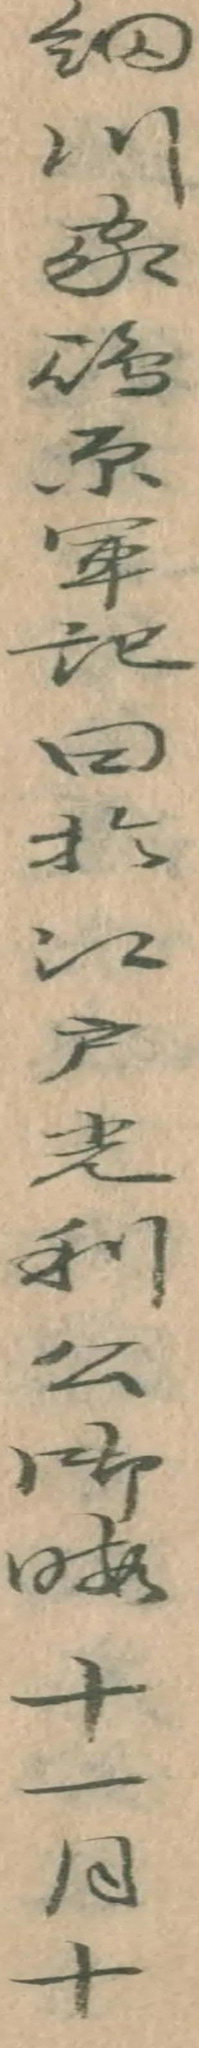細川家島原軍記曰於江戸光利公御暇十一月十
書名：切支丹御退治記 49巻. [3]
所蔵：国立国会図書館 National Diet Library, JAPAN
